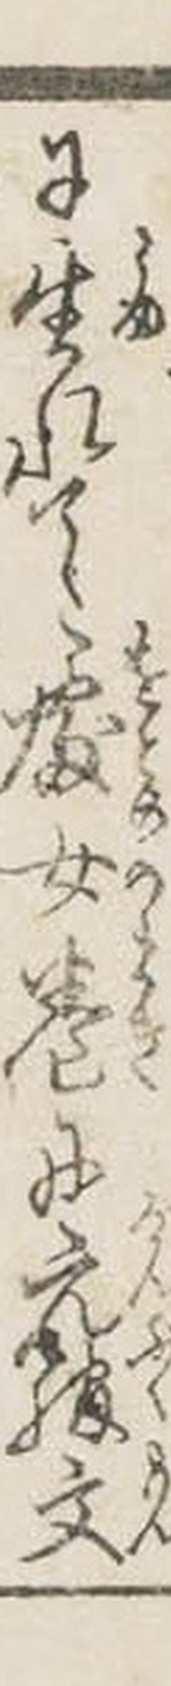に生れて処女巻に元服文
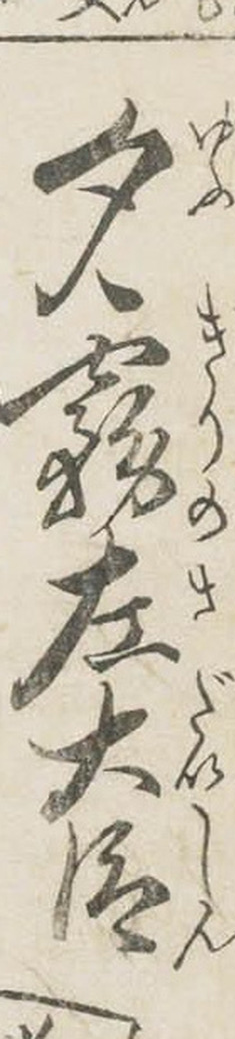夕霧左大臣
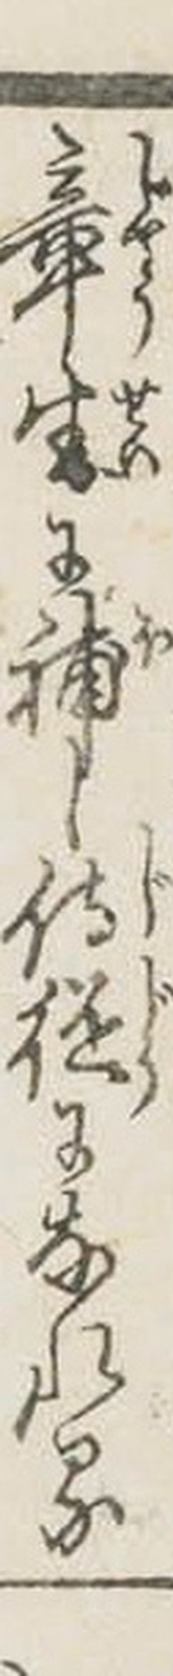章生に補し侍従になれる
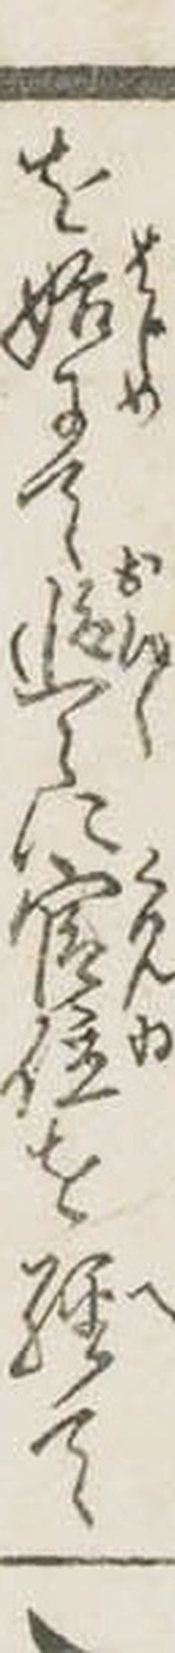を始にて追々に官位を経て
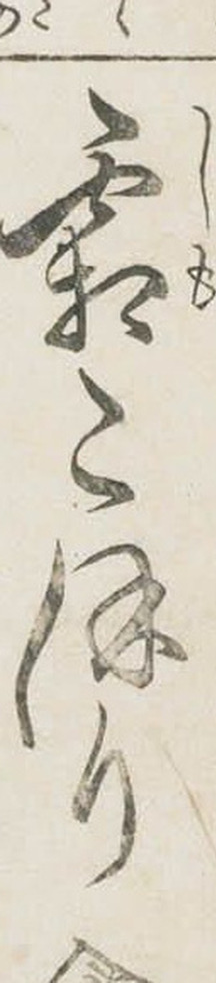霜こほり
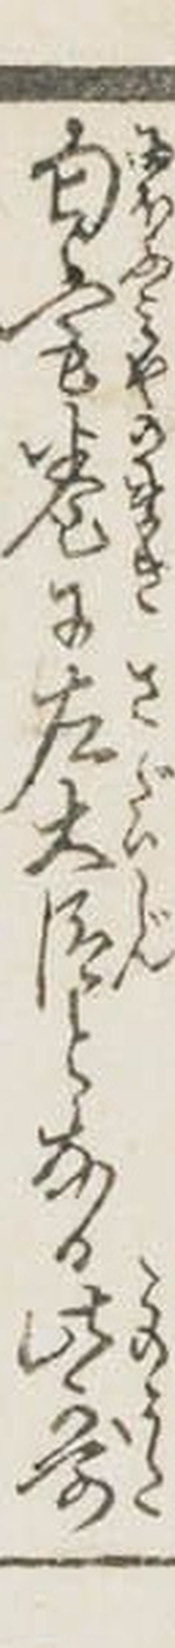匂宮巻に左大臣となる此哥
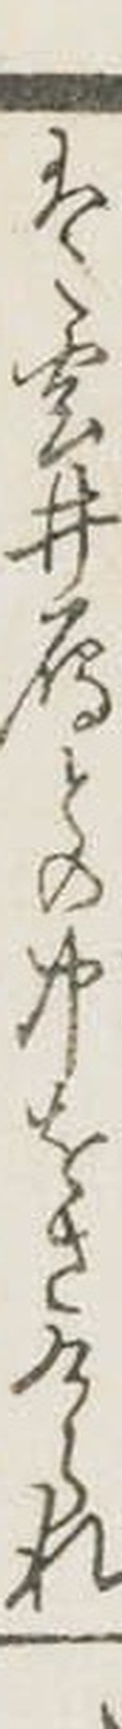は雲井鴈との中をさけられ
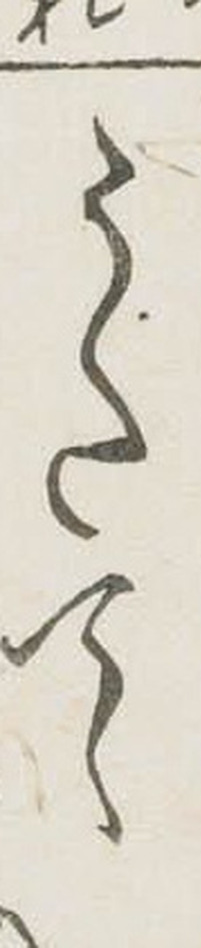うたて
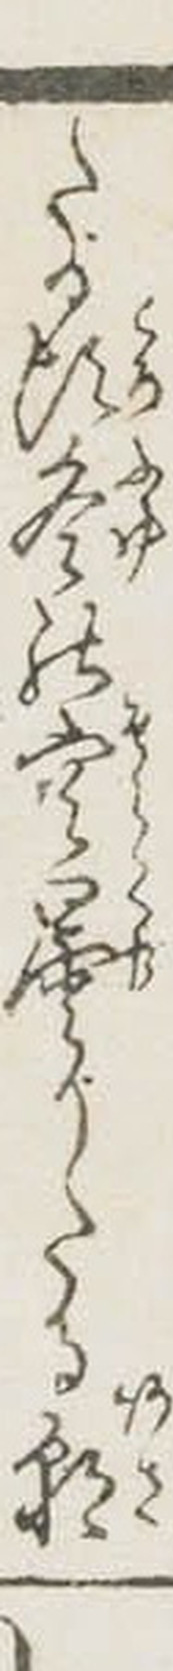たる頃冬の空曇りたる朝
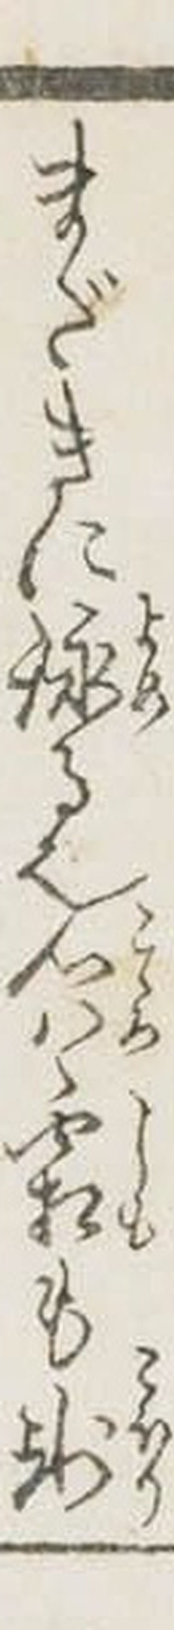まだきに詠る也心は霜も氷
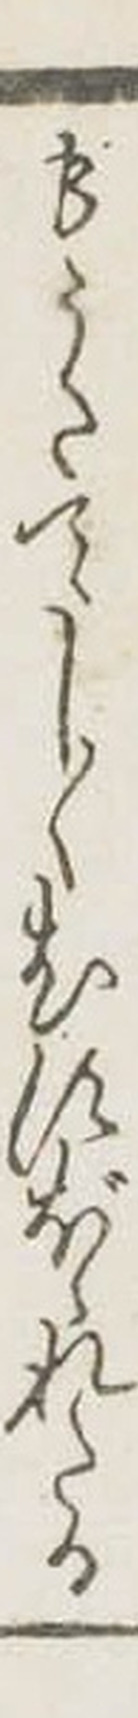もうたてしくむすぼゝれたる
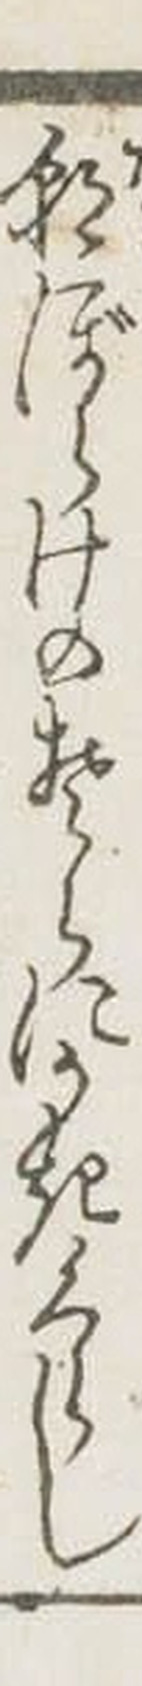朝ぼらけのそらにかきくらし
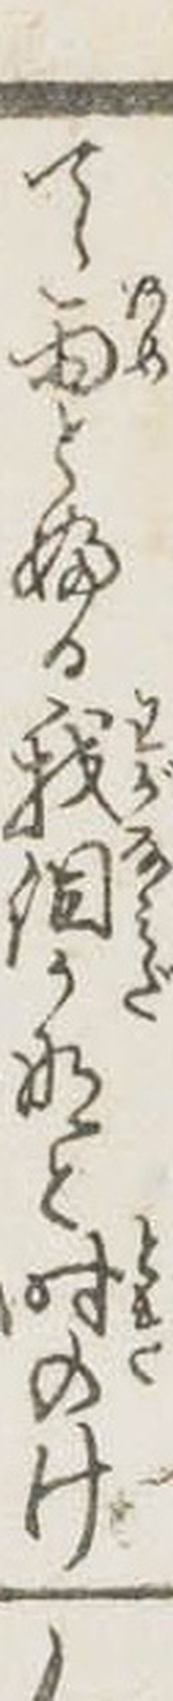て雨とふる我泪かなと時のけ
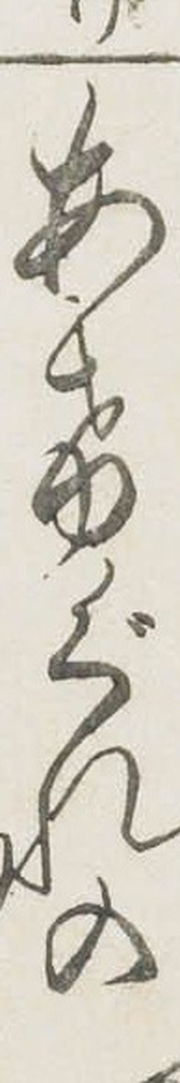あけぐれの
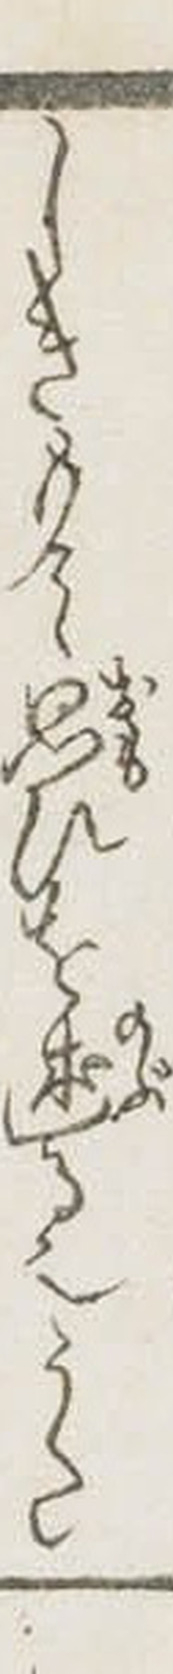しきもて思ひを述る也うた
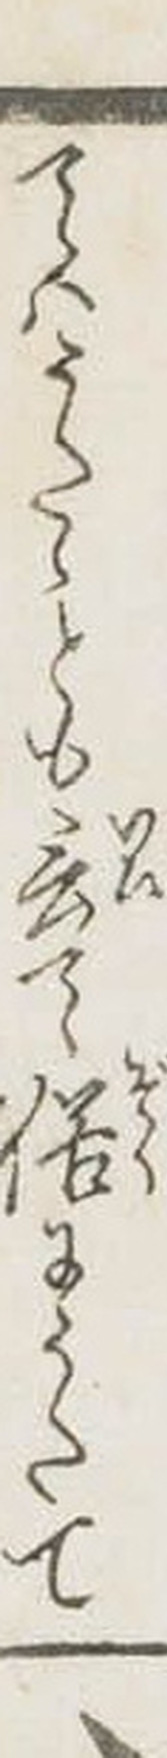てはうたゝとも言て俗にうたて
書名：源氏百人一首
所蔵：東京学芸大学教育コンテンツアーカイブ
